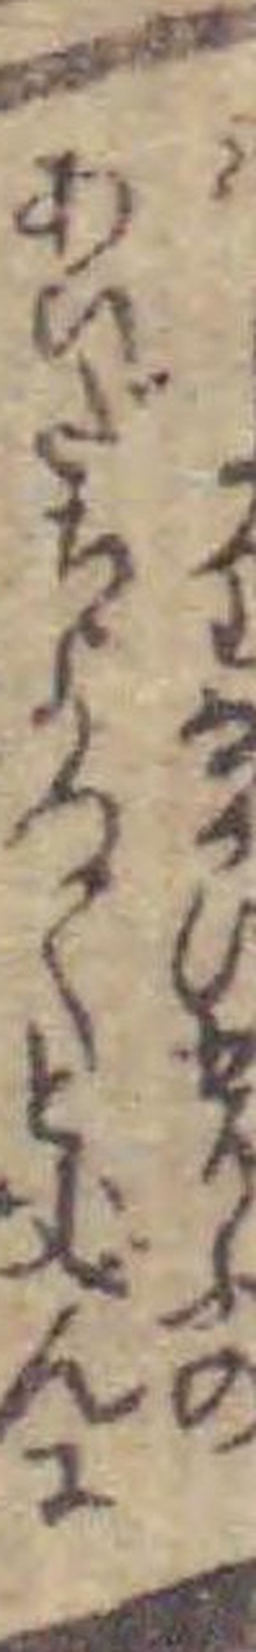あいだちよろ〳〵と小べんに
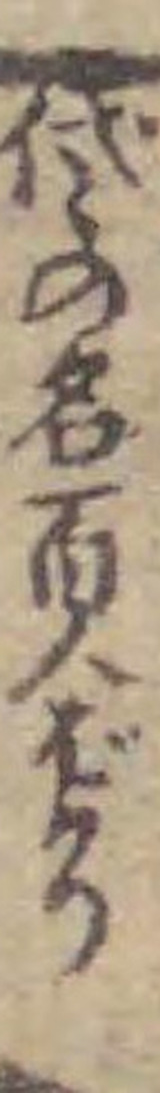代々の名百人ばかり
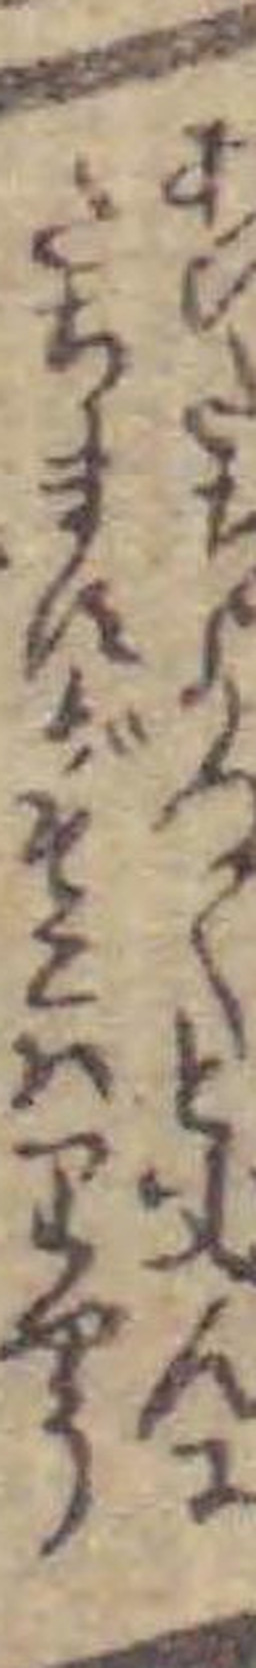たちますがそこはりやう
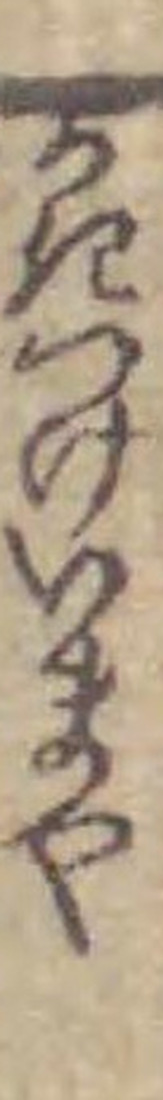かきつけいまや
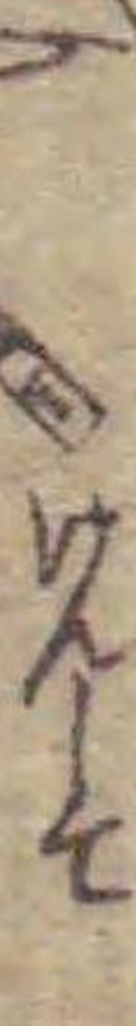けんして
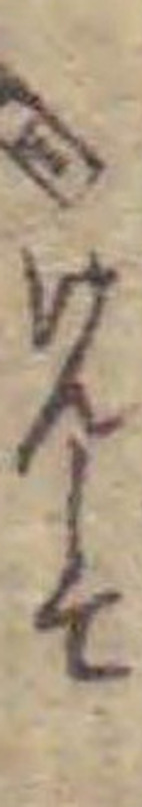けんして
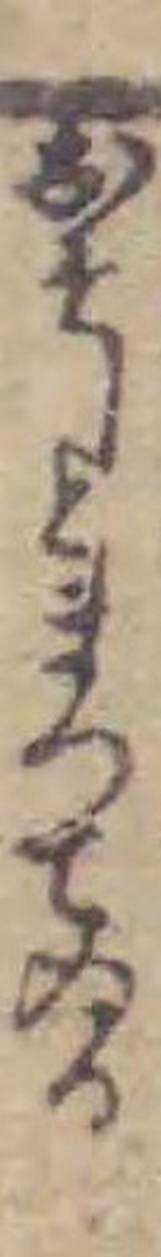おそしとまつてゐる
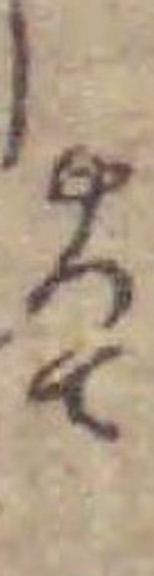やつて
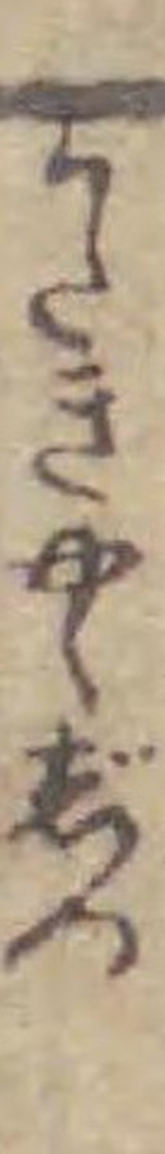かたきやくじつ
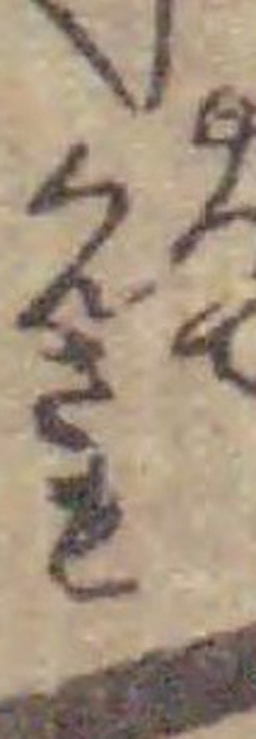くんされ
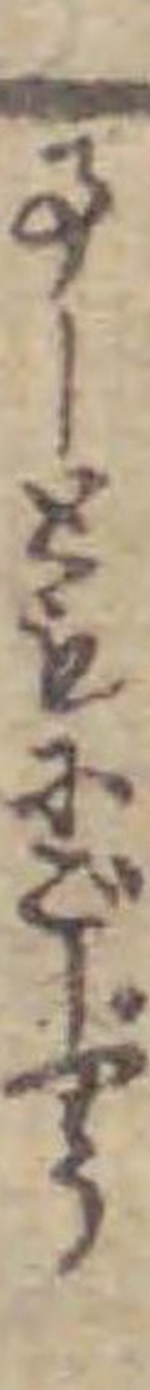事しともにごじやう
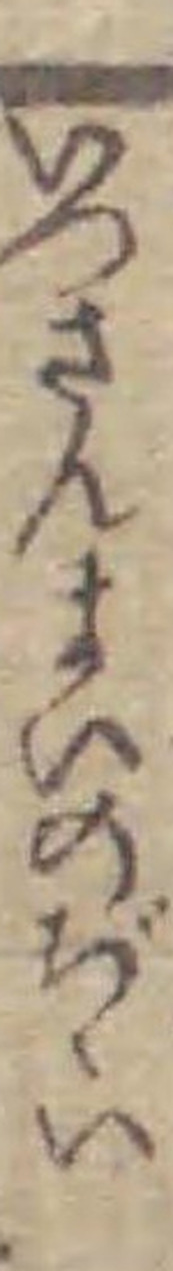いつさんまいのぢゝい
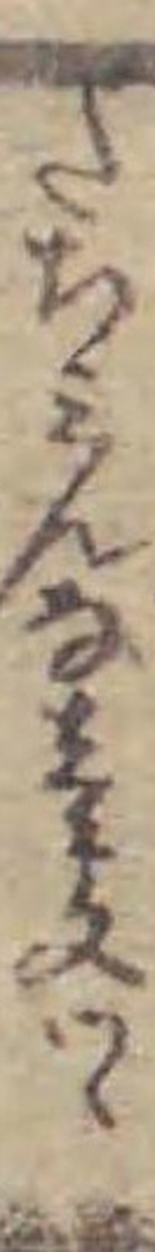たちみんな壱文ツヽ
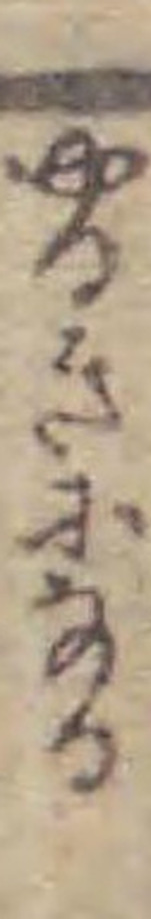やるきになる
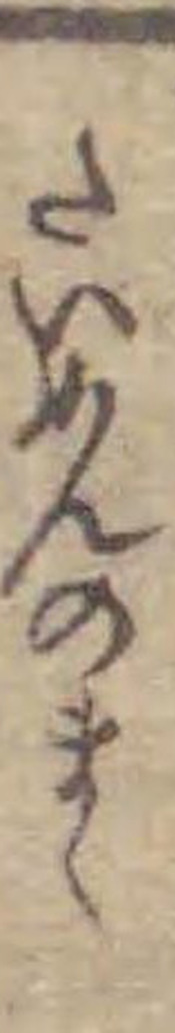たいめんのまゝ
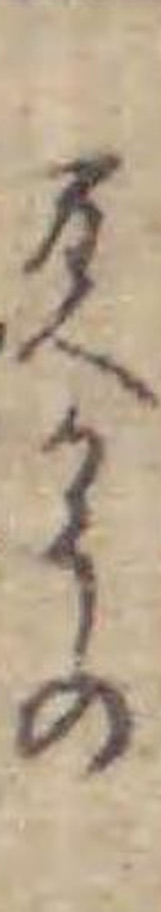万人かうの
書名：年寄之冷水曽我 : 3巻
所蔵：国立国会図書館 National Diet Library, JAPAN
